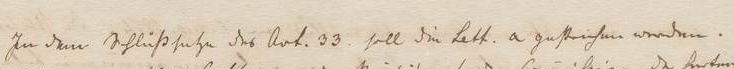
In dem Schlußsatze des Art. 33. soll die Lett. a gestrichen werden.
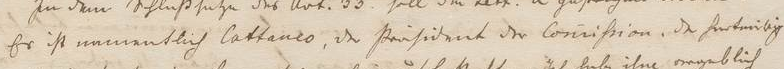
Es ist namentlich Cattaneo, der Präsident der Commißion, der hartnäckig
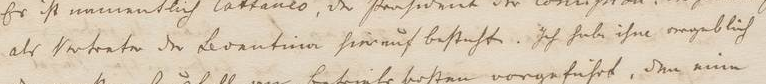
als Vertreter der Levantina hierauf besteht. Ich habe ihm vergeblich
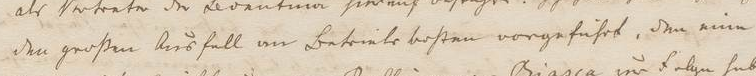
den großen Ausfall an Betriebskosten vorgeführt, den eine
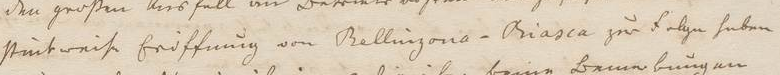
stückweise Eröffnung von Bellinzona–Biasca zur Folge haben
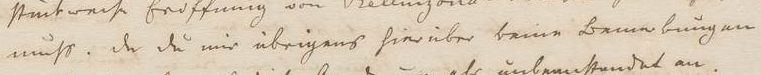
muß. Da Du mir übrigens hierüber keine Bemerkungen
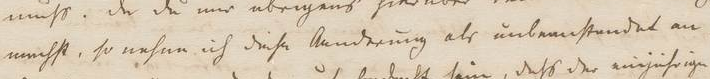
machst, so nehme ich diese Aenderung als unbeanstandet an.
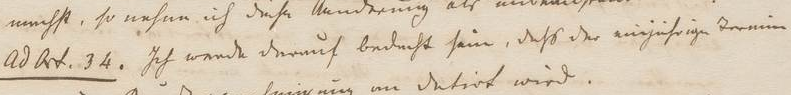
Ad Art. 34. Ich werde darauf bedacht sein, daß der einjährige Termin
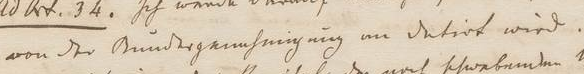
von der Bundesgenehmigung an datirt wird.
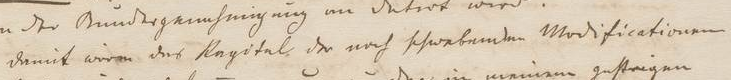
Damit wäre das Kapital der noch schwebenden Modificationen
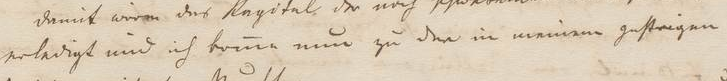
erledigt und ich komme nun zu den in meinem gestrigen
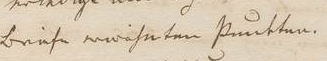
Briefe erwähnten Punkten.
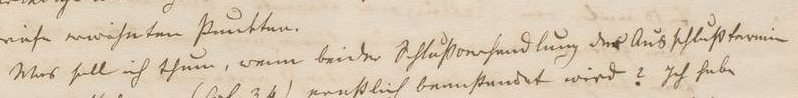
Was soll ich thun, wenn bei der Schlußverhandlung der Auschlußtermin
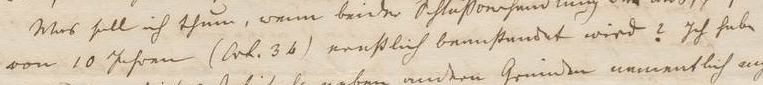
von 10 Jahren (Art. 34) ernstlich beanstandet wird? Ich habe
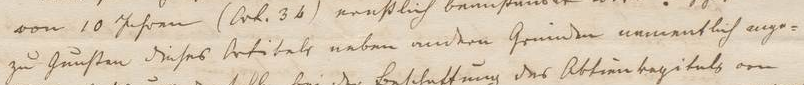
zu Gunsten dieses Artikels neben andern Gründen namentlich ange-
